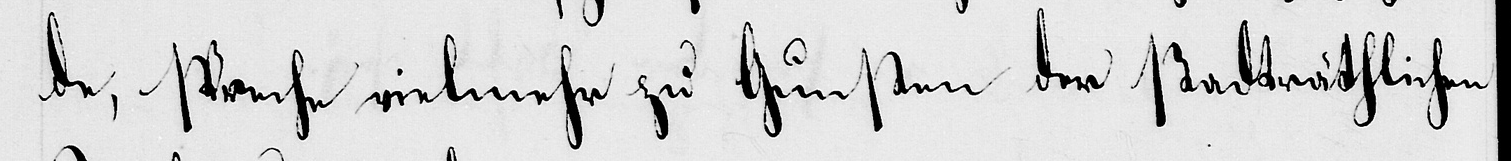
de, spreche vielmehr zu Gunsten der stadträthlichen
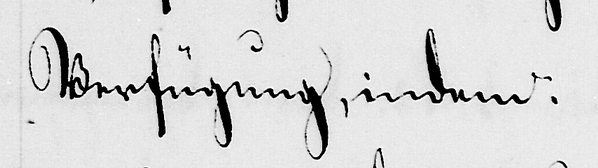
Verfügung, indem:
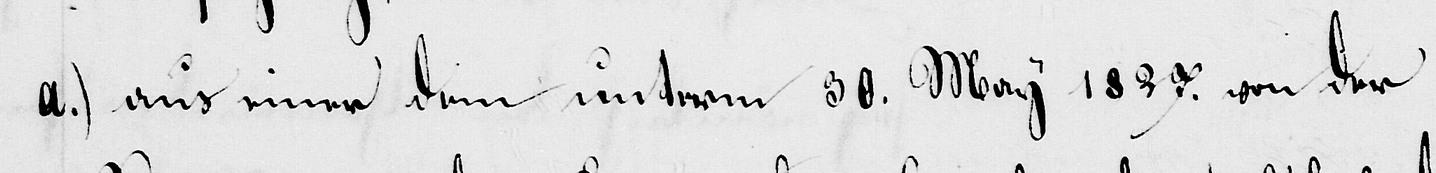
a.) aus einer dem unterm 30. May 1827. von der
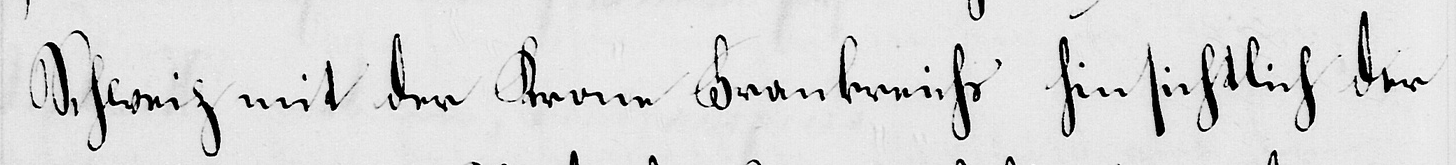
Schweiz mit der Krone Frankreichs hinsichtlich der
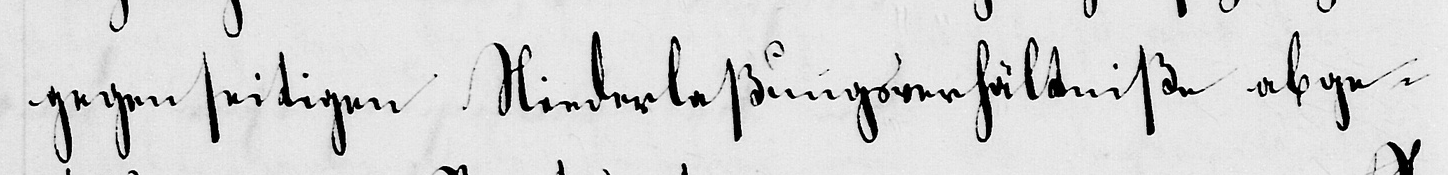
gegenseitigen Niederlaßungsverhältniße abge¬
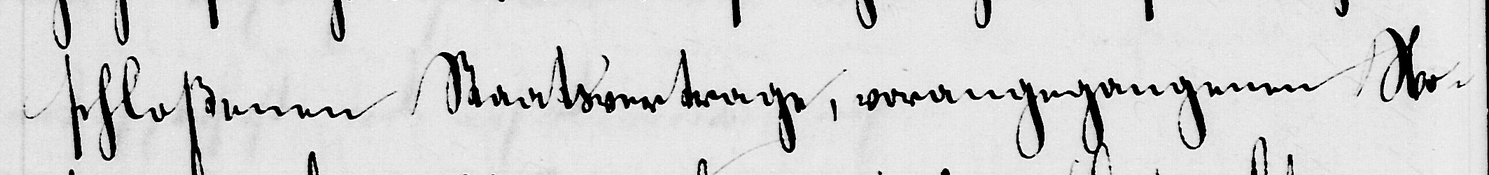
schloßenen Staatsvertrage, vorangegangenen No¬
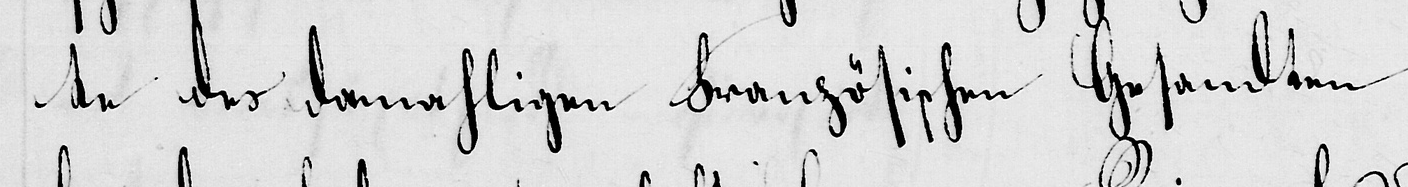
te des damahligen Französischen Gesandten
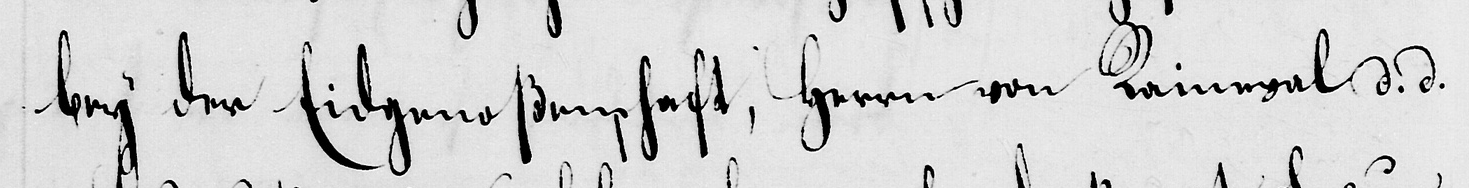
bey der Eidgenoßenschaft, Herrn von Raineval d. d.
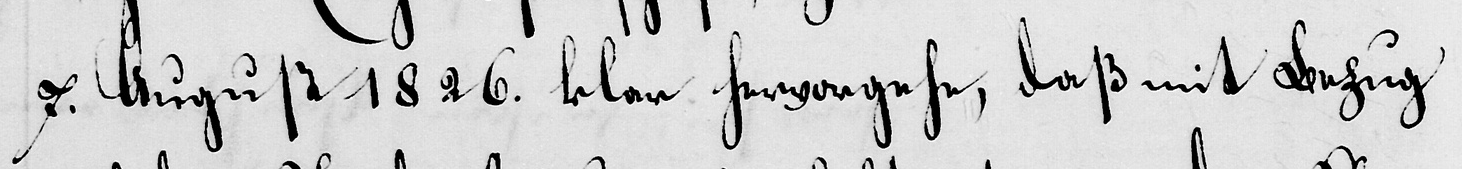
7. August 1826. klar hervorgehe, daß mit Bezug
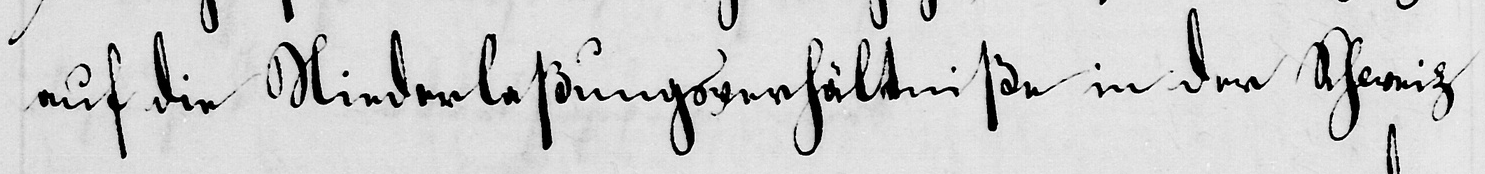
auf die Niederlaßungsverhältniße in der Schweiz
